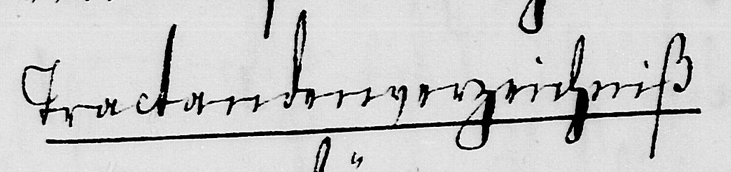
Tractandenverzeichniß
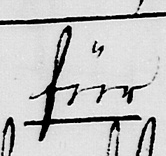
für
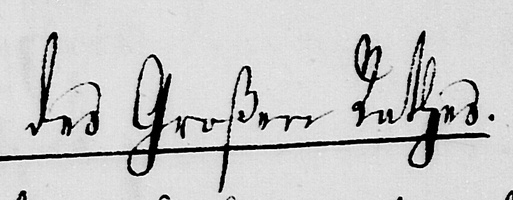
des Großen Rathes.
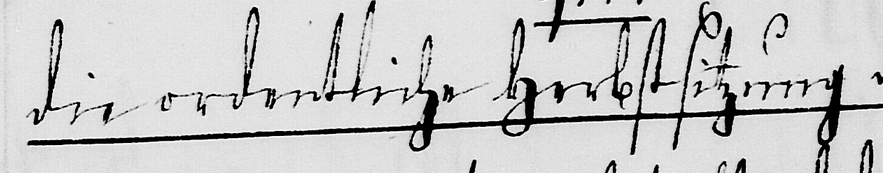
die ordentliche Herbstsitzung
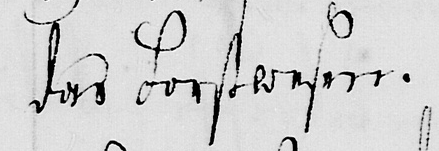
das Forstwesen.
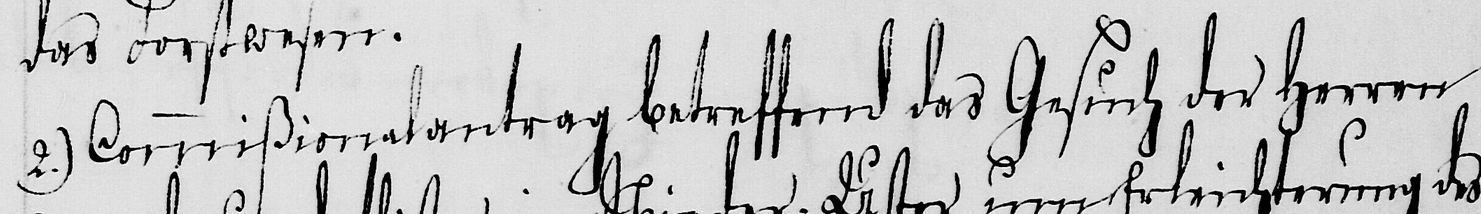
2.) Commißionalantrag betreffend das Gesuch der Herren
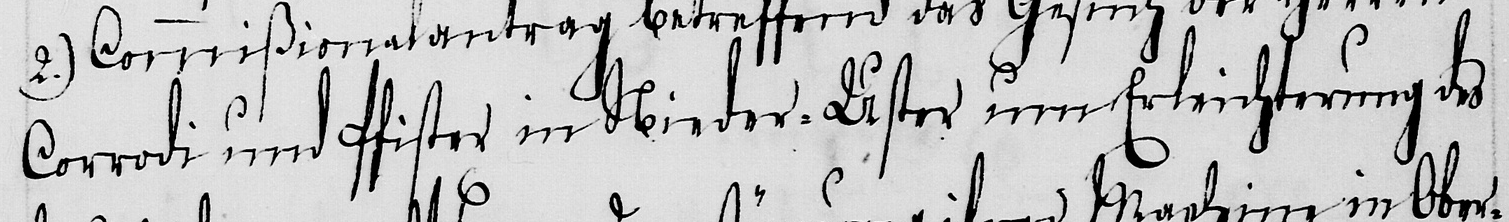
Corrodi und Pfister in Nieder-Uster um Erleichterung des
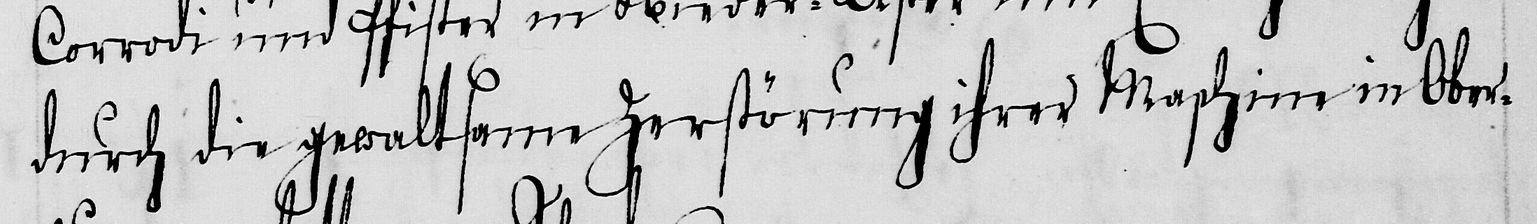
durch die gewaltsame Zerstörung ihrer Maschine in Obe¬
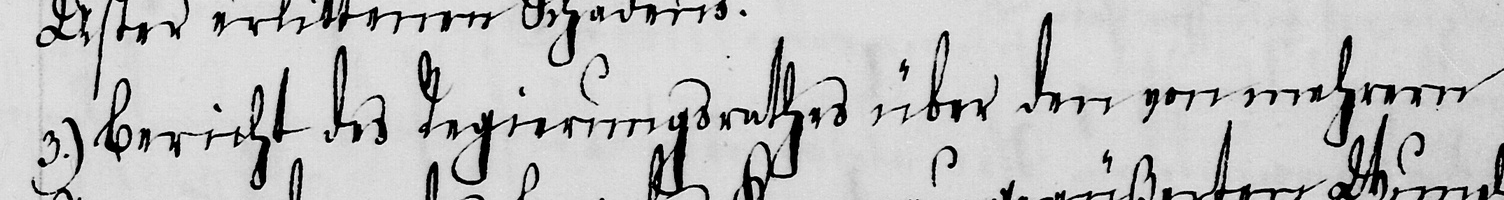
3.) Bericht des Regierungsrathes über den von mehrern
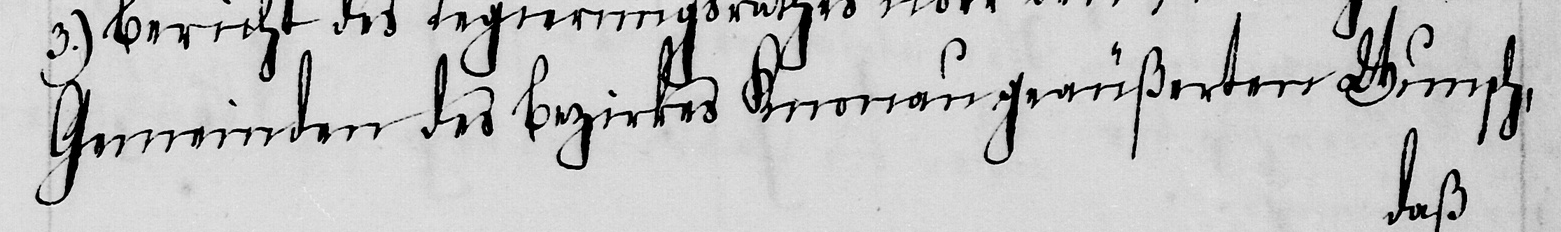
Gemeinden des Bezirkes Knonau geäußerten Wunsch,
